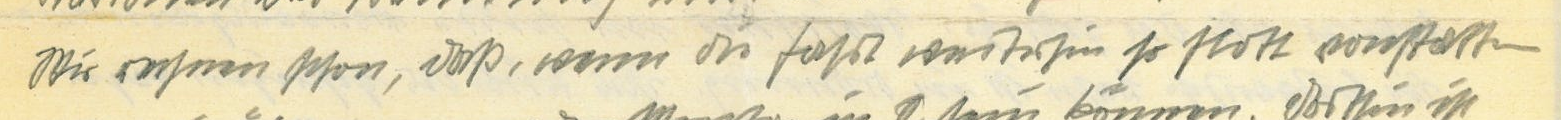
Wir rechnen schon, daß, wenn die Fahrt weiterhin so flott vonstatten
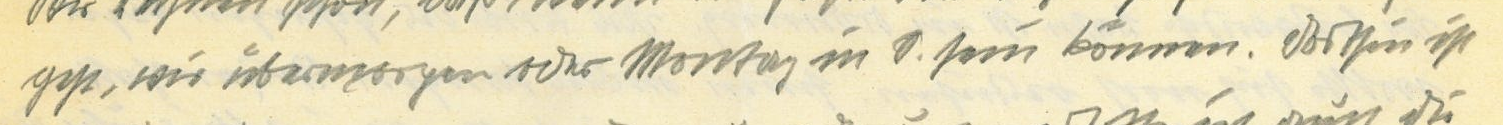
geht, wir übermorgen oder Montag in S. sein können. Dorthin ist
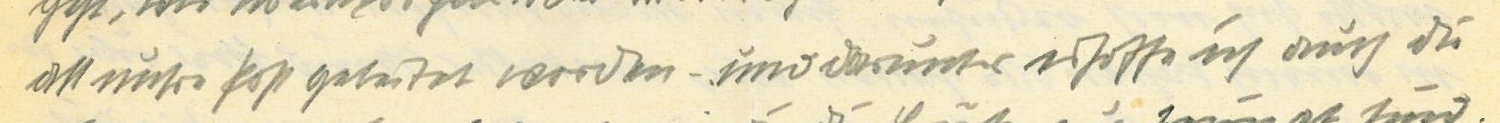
all unsre Post geleitet worden – und darunter erhoffe ich auch die
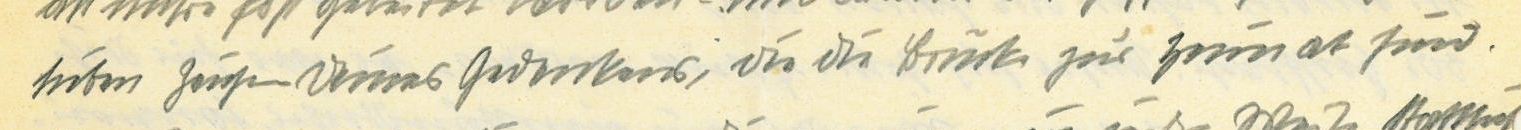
lieben Zeichen Deines Gedenkens, die die Brücke zur Heimat sind.
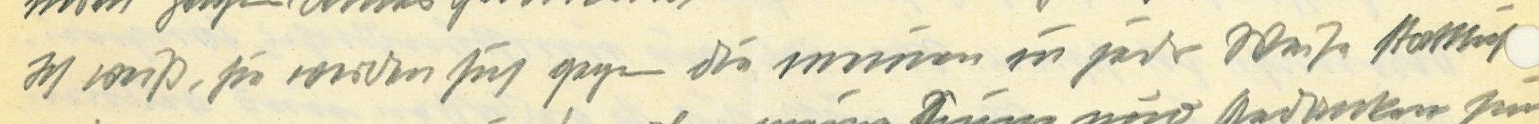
Ich weiß, sie werden sich gegen die meinen in jeder Weise stattlich
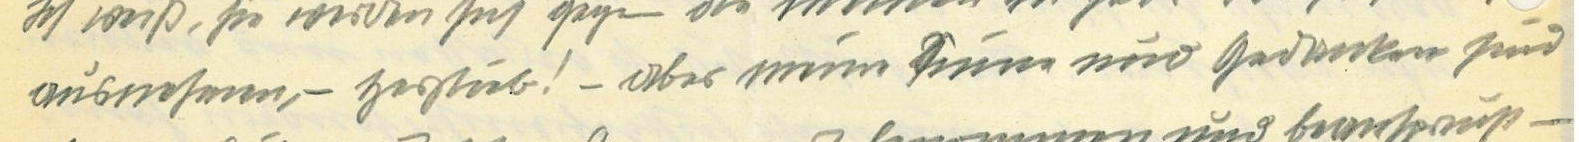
ausnehmen – Herzlieb! – aber meine Sinne und Gedanken sind
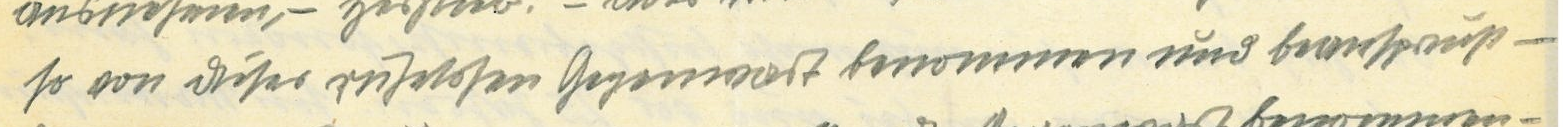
so von dieser ruhelosen Gegenwart benommen und beansprucht –
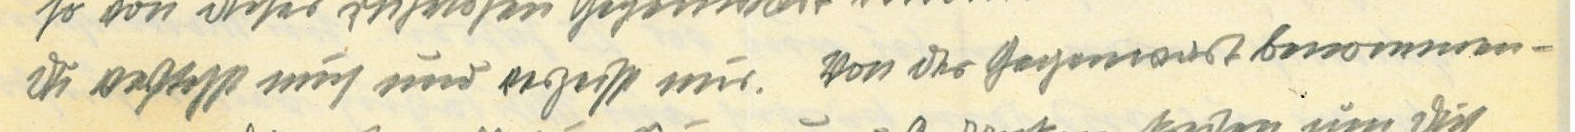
Du verstehst mich und verzeihst mir. Von der Gegenwart benommen –
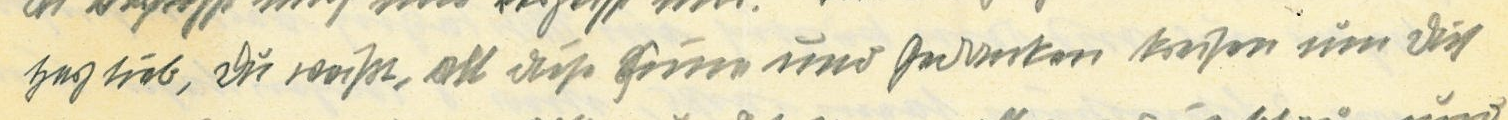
Herzlieb, Du weißt, all diese Sinne und Gedanken kreisen um Dich
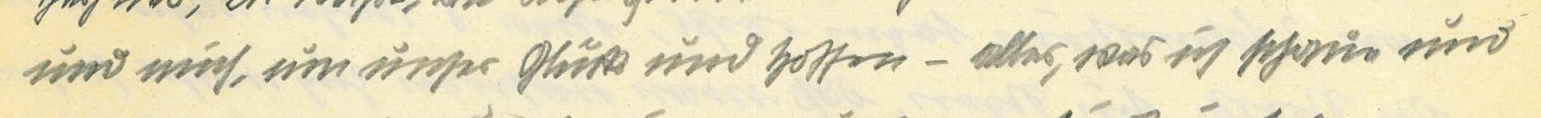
und mich, um unser Glück und Hoffen – alles, was ich schaue und
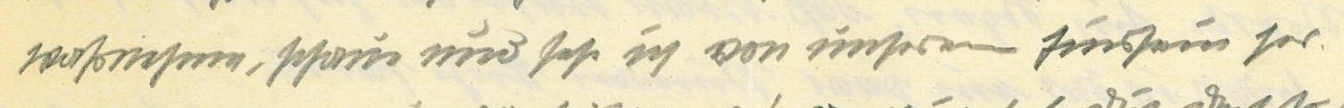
wahrnehme, schaue und sehe ich von unserm Einssein her.
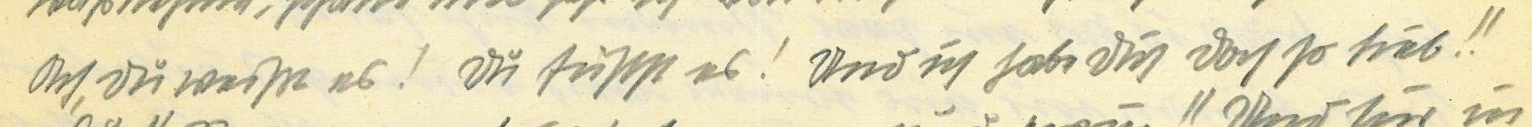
Ach, Du weißt es! Du fühlst es! Und ich habe Dich doch so lieb!!
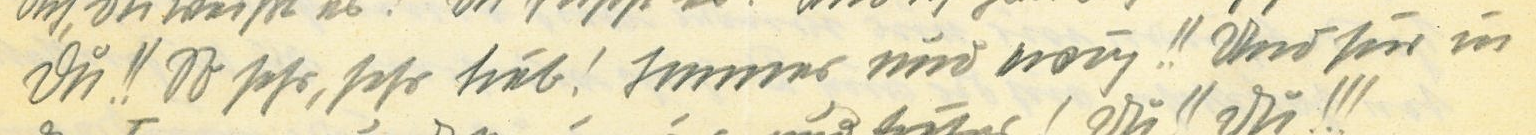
Du!! So sehr, sehr lieb! Immer und ewig!! Und hier in
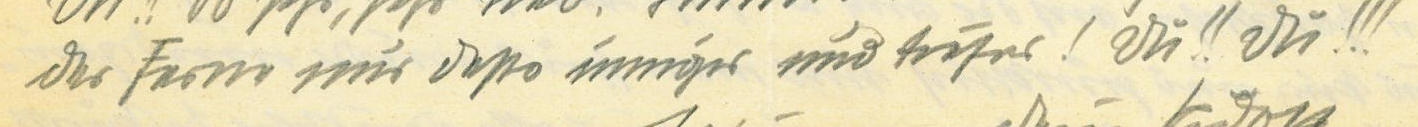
der Fremde nur desto inniger und tiefer! Du!! Du!!!
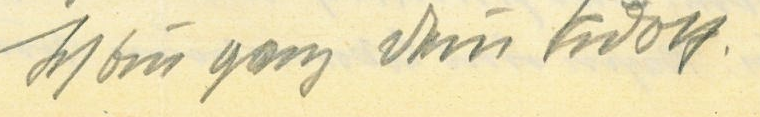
Ich bin ganz Dein .
